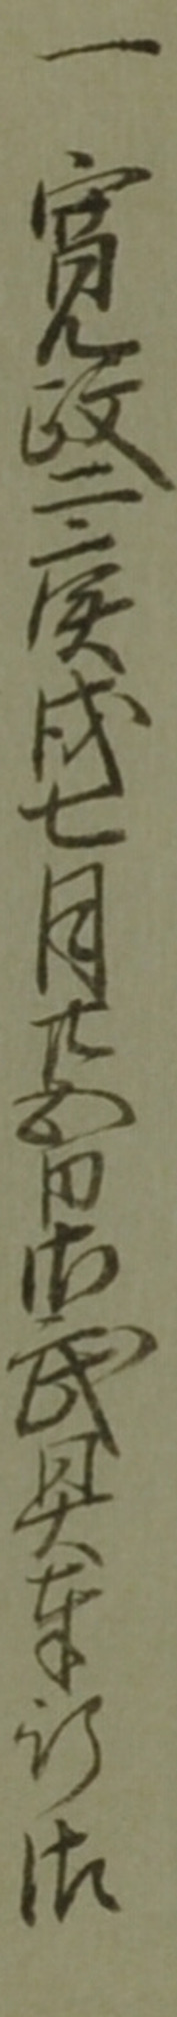一寛政二庚戌七月廿五日御武具奉行御
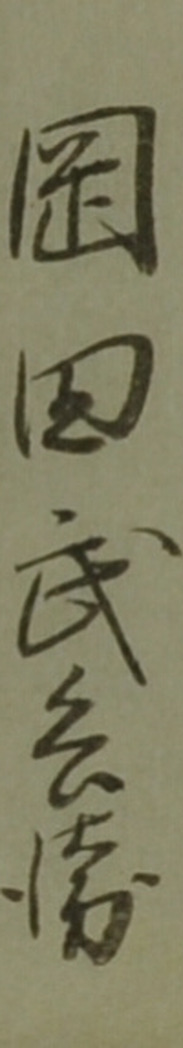岡田武兵衛
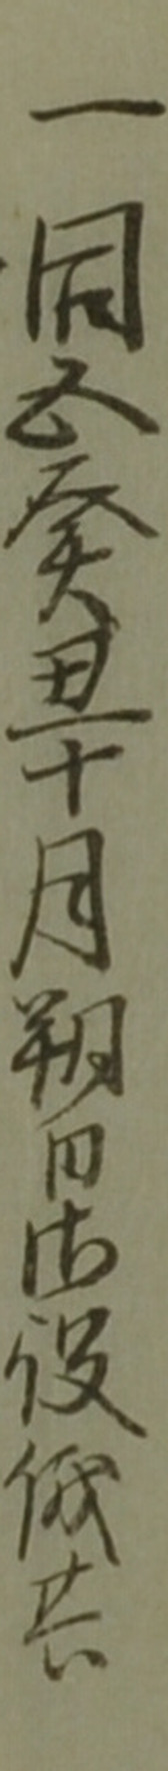一同五癸丑十月朔日御役儀共
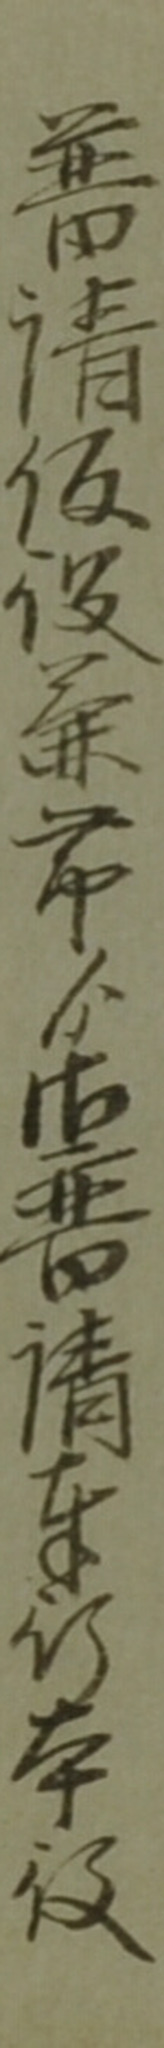普請仮役兼帯ゟ御普請奉行本役
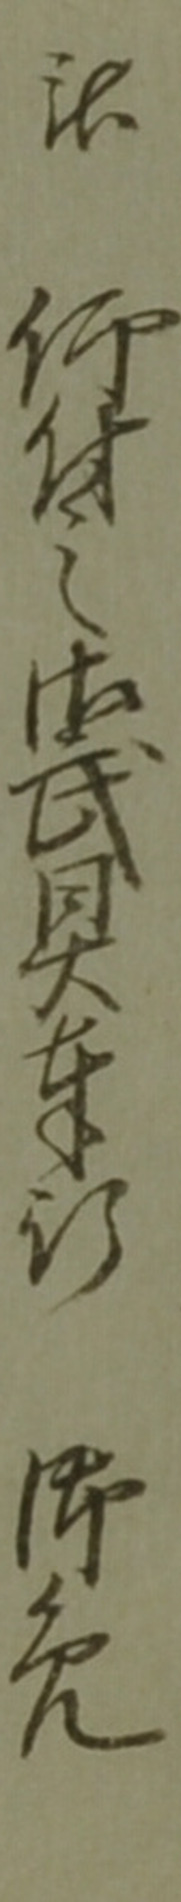被仰付之御武具奉行御免
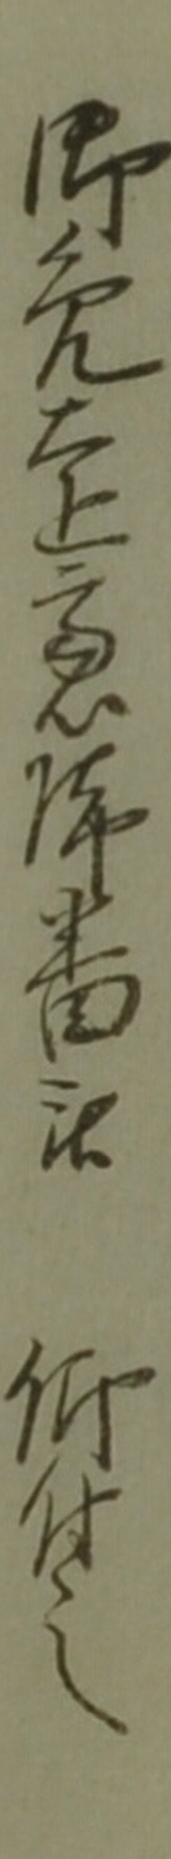御免遠慮帰番被仰付之
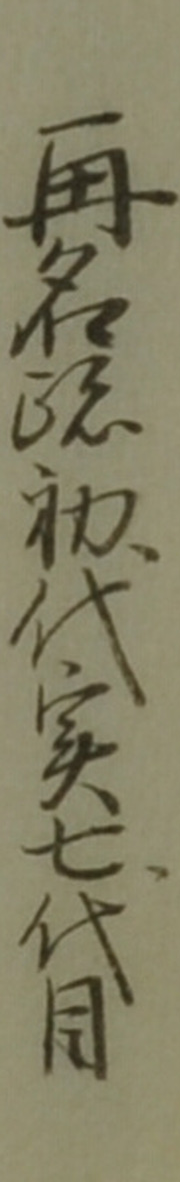再名跡初代実七代目
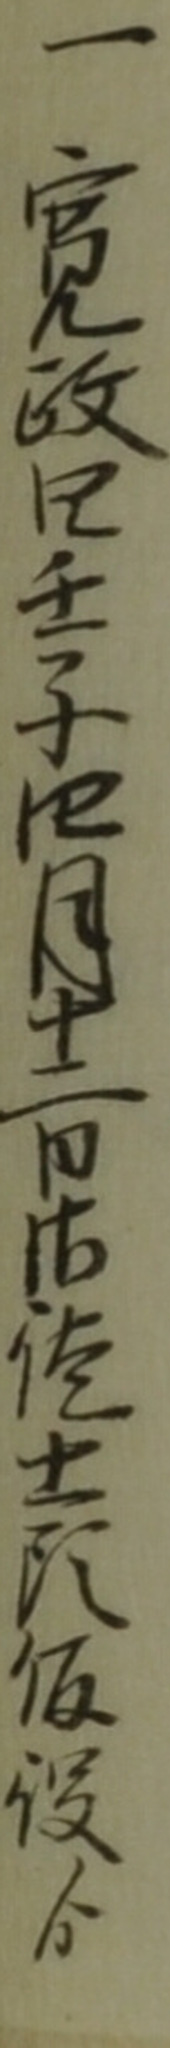一寛政四壬子四月十二日御徒士頭仮役ゟ
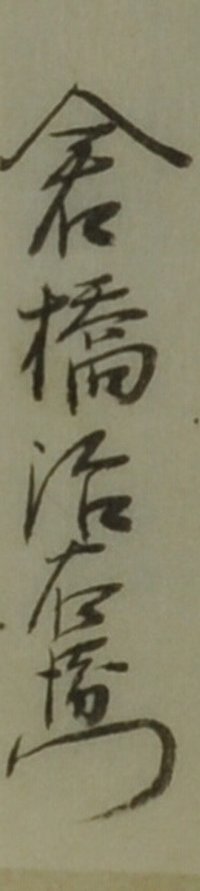倉橋治右衛門
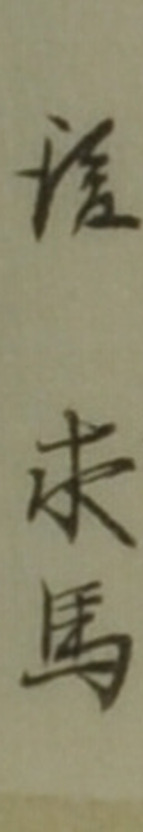後求馬
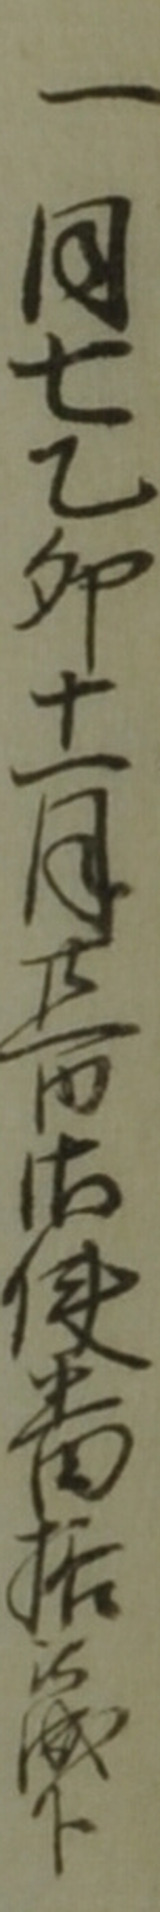一同七乙卯十一月廿一日御使番格被成下
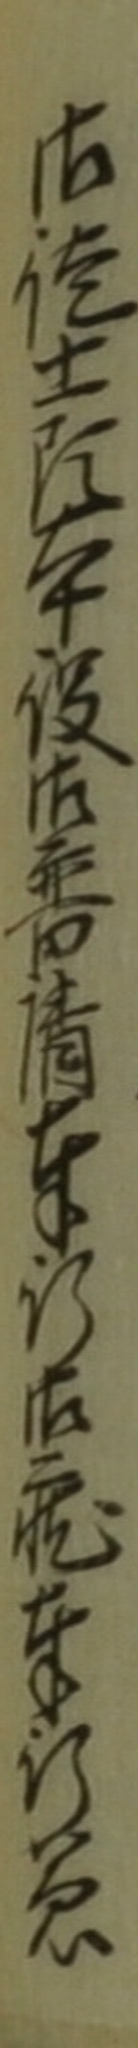御徒士頭本役御普請奉行御蔵奉行兼
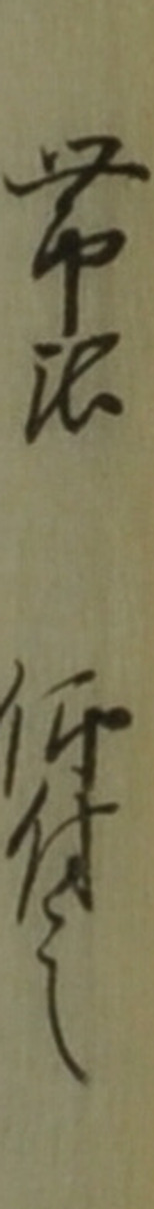帯被仰付之
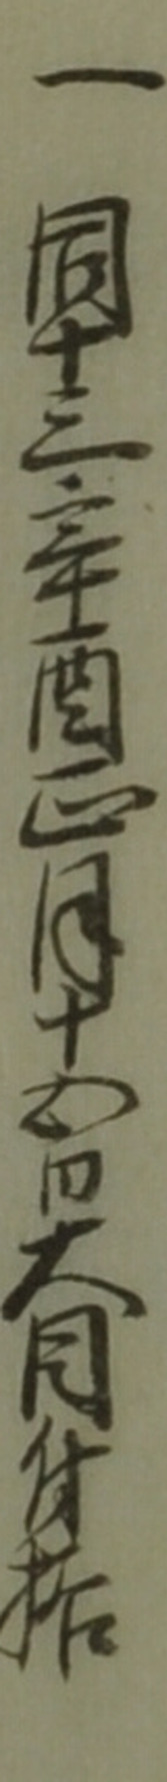一同十三辛酉正月十五日大目付格
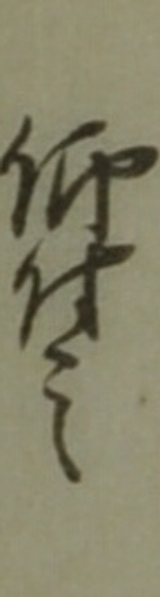仰付之
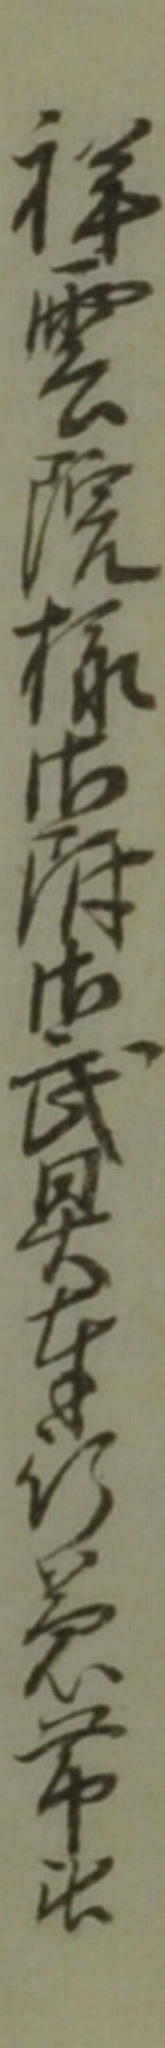祥雲院様恩附御武具奉行兼帯被
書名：諸御役代々録（六）
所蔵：伊那市立高遠町図書館・合同会社AMANE
